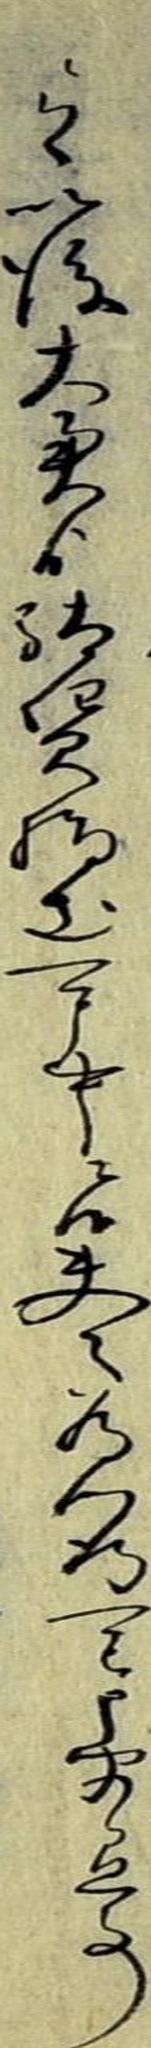候はゝ以後大奥ゟ駄賃指出可申事に候夫々為心得可被申聞置事
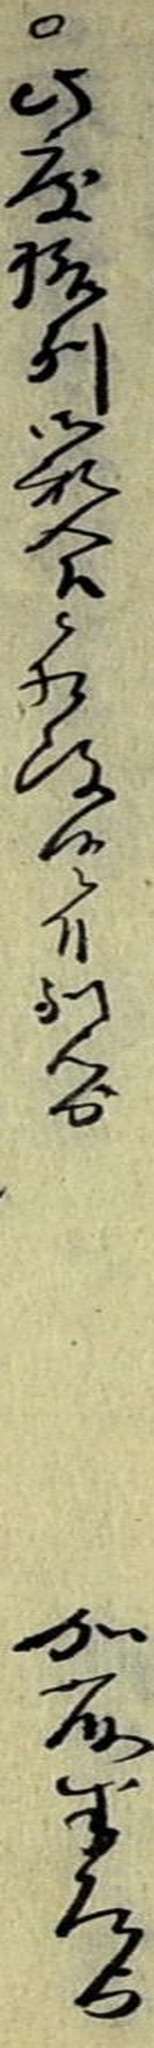〇此度格別御形合被相改候に付別紙加藤半左衛門
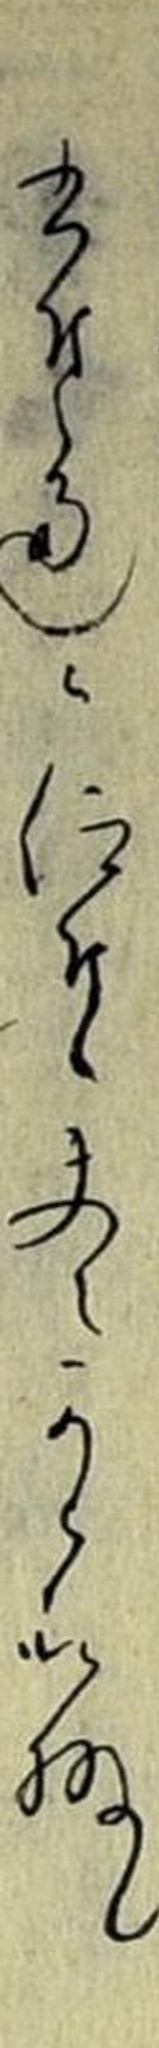書付之通被仰付候夫々可被取御扱候
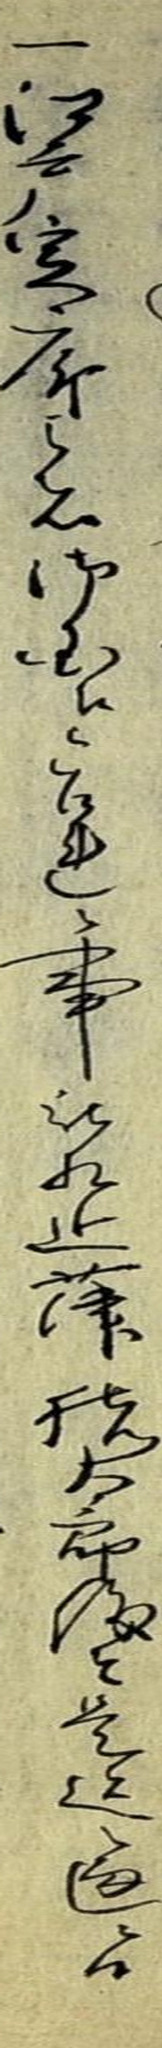一江戸定府之者御国え被召連候事被相止葎猪太郎儀は是迄之通に候
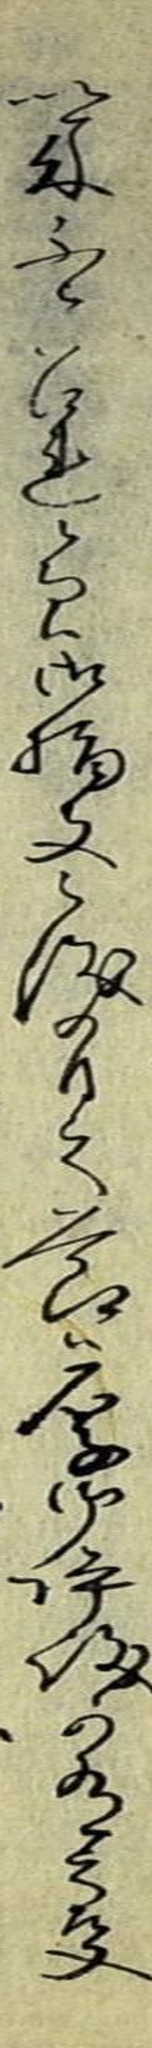以来不被召連候而は御指支之儀有之節は厚御評議可有之事
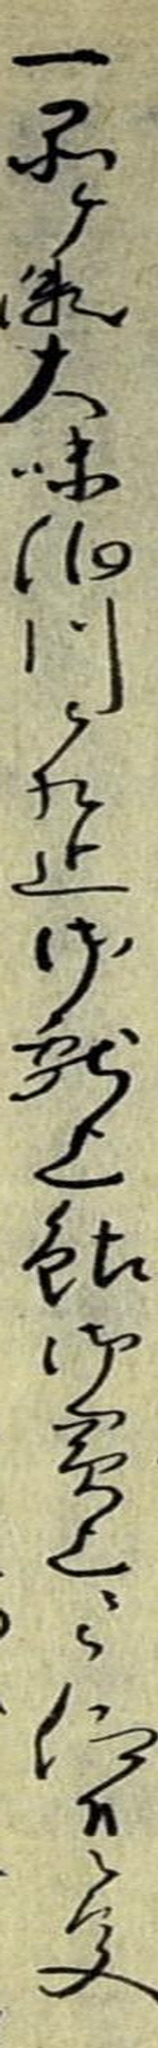一品ケ瀬大味泊川被相止御献上鮎御買上に被仰付候事
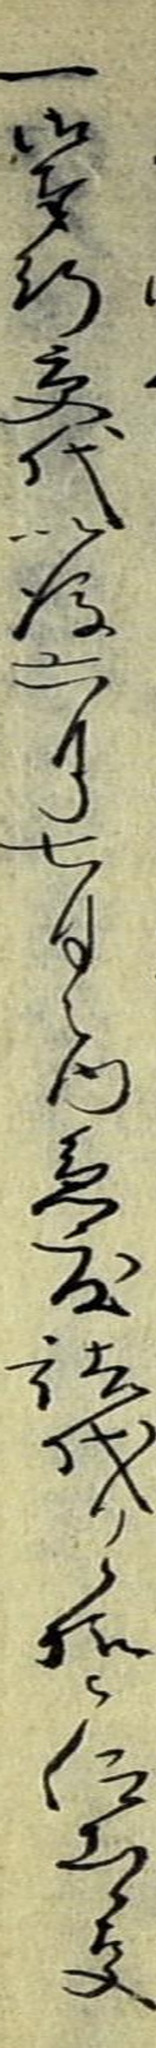一御奉行交代以後六月七月之内急度詰代り候様被仰出候事
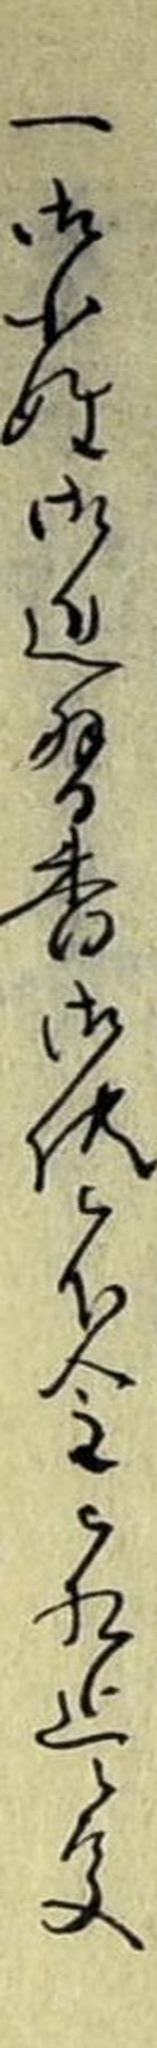一御小姓御近習番御供被下金被相止候事
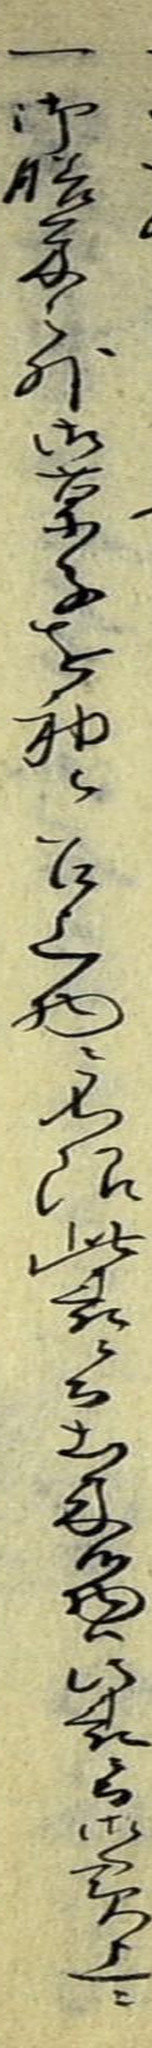一御膳米之外御菓子を初被召上物に不限此表に而出来候物は此表に而御買上に
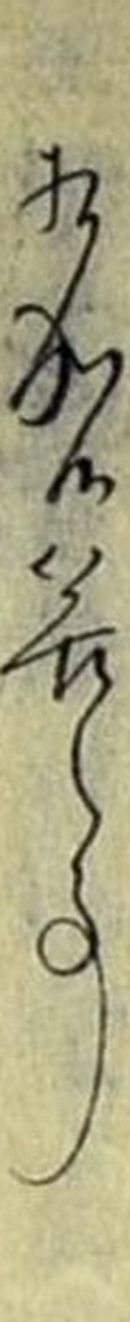相成候筈之事
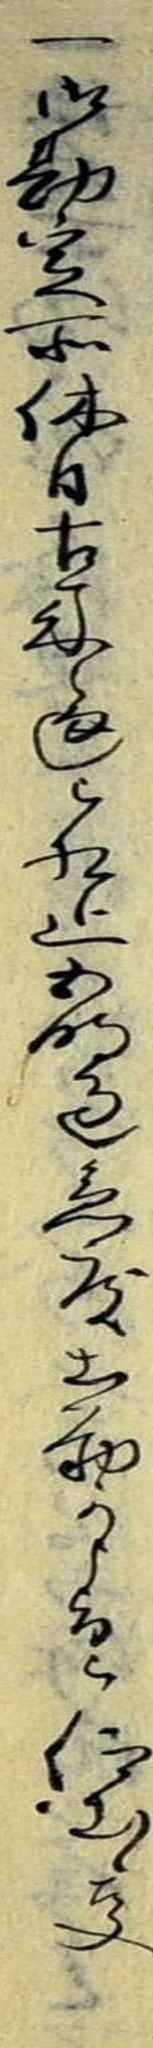一御勘定所休日古来之通被相止五時過急度出勤可申旨被仰出候事

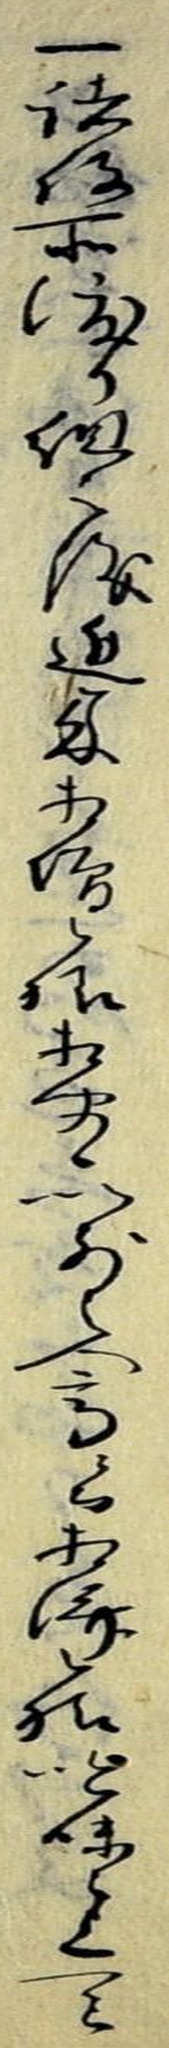一諸役所渡り組之儀近来相増候様相聞候以前之人馬に而相済候様吟味之上可被
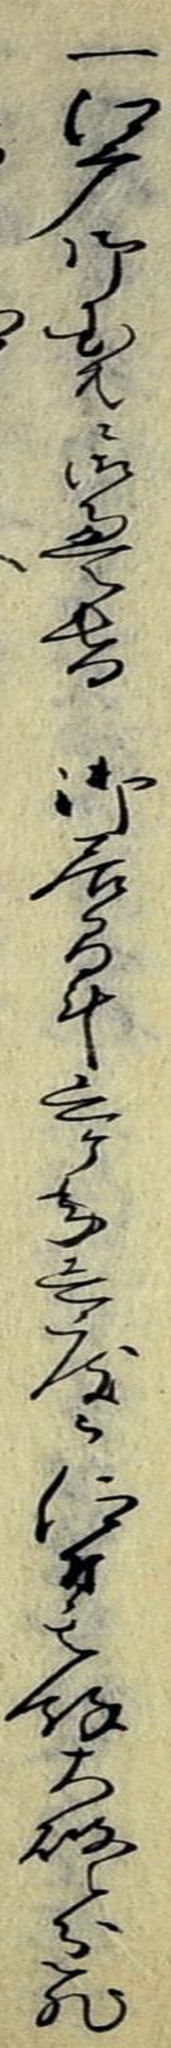一江戸御国共に御畳替御居間斗壱ヶ年壱度被仰付其余大破之分飛
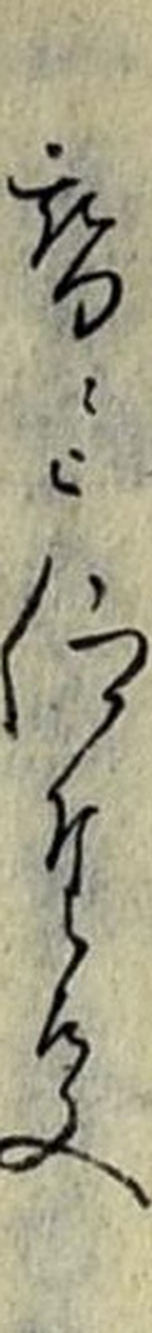替に被仰付候事
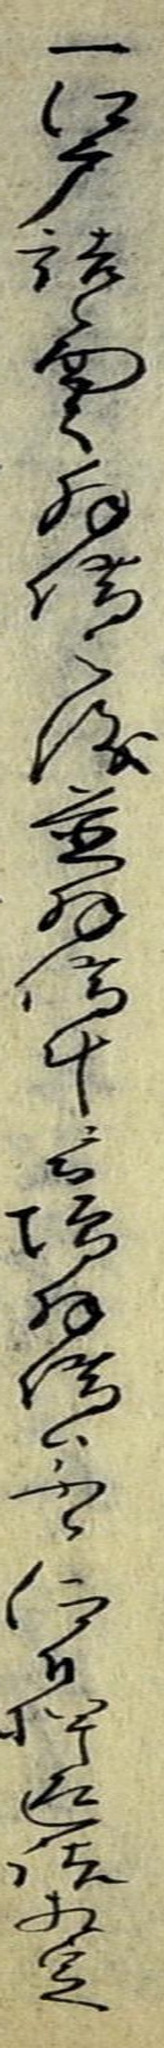一江戸詰之面々拝借之儀並拝借斗に而増拝借は不被仰付押返詰相定
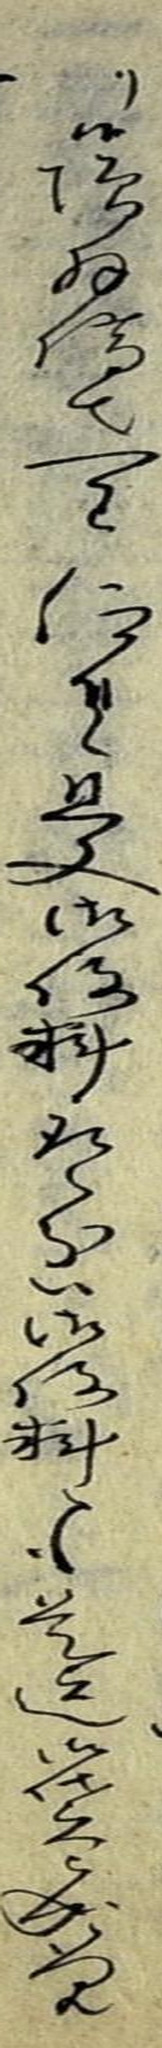り候増拝借は可被仰付候且又御役料取之分は御役料へも是迄御貸被成候得共
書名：命令之部 二
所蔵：福井県文書館 Fukui Prefectural Archives
